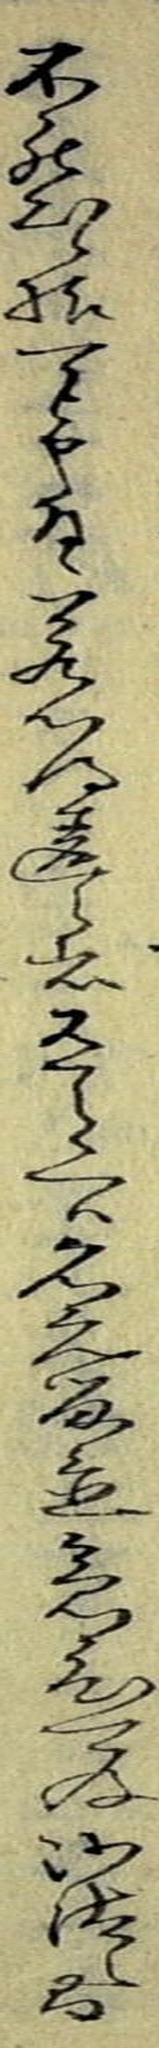不罷出候様可被申付候若心得違之者有之候へハ名元留置急度可及沙汰候間
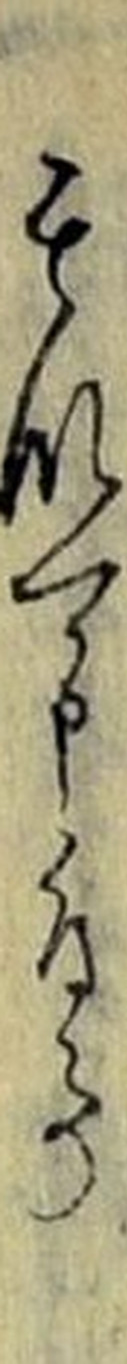其段可申付事
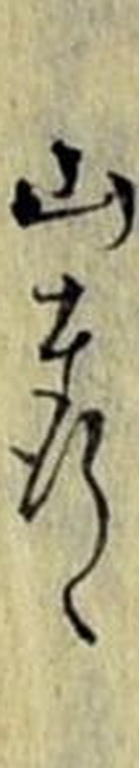山奉行へ
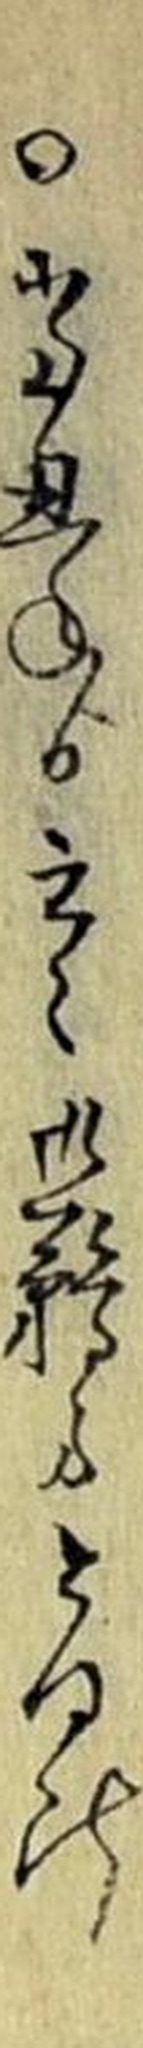○当丑年ゟ云々御鵜方と同断
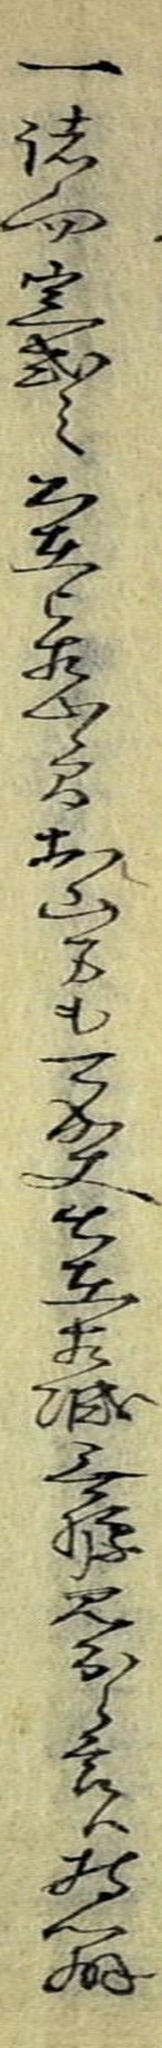一諸向定式之出在被相止候間於山方も可成丈出在相減無拠見分之節ハ持弁
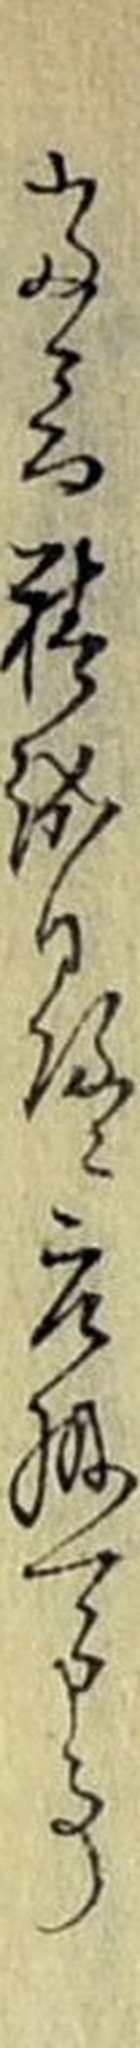当ニ而精誠日帰ニ取扱可申事
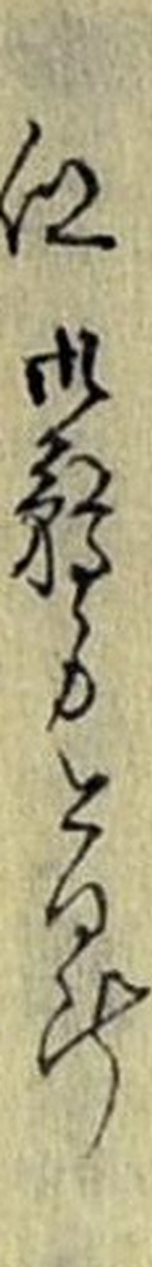但御鵜方と同断
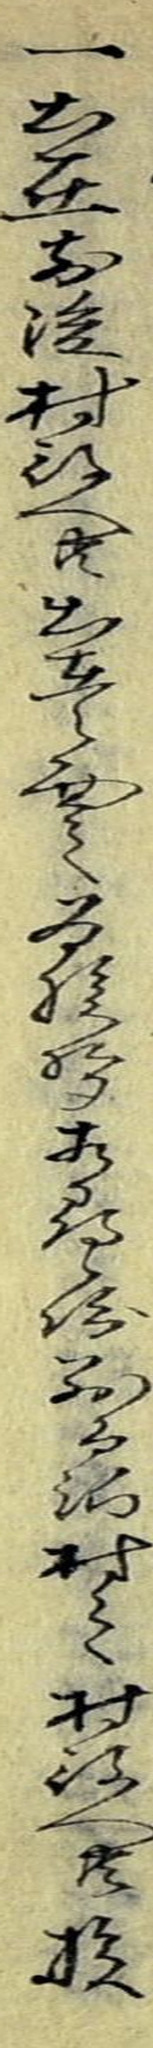一出在前後村役人共出在之面々へ為挨拶相尋候儀別而泊村之役人共挨
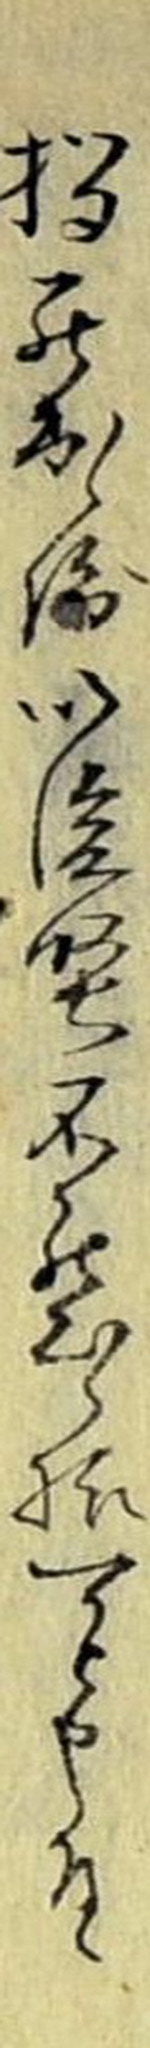拶罷出候儀以後堅不罷出候様可被申付候
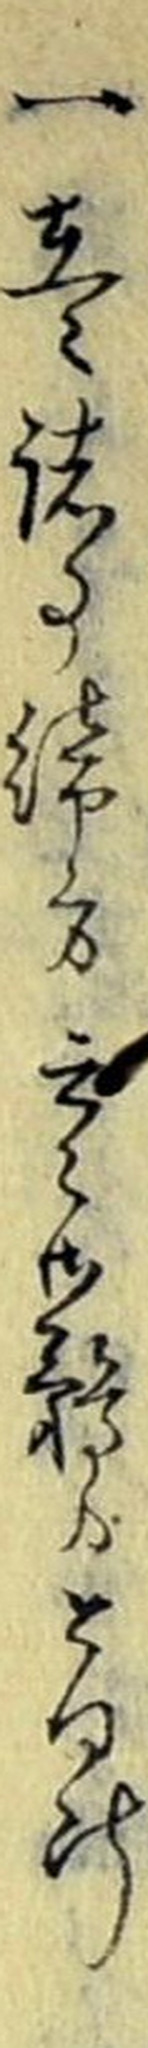一在々諸事締方云々御鵜方と同断
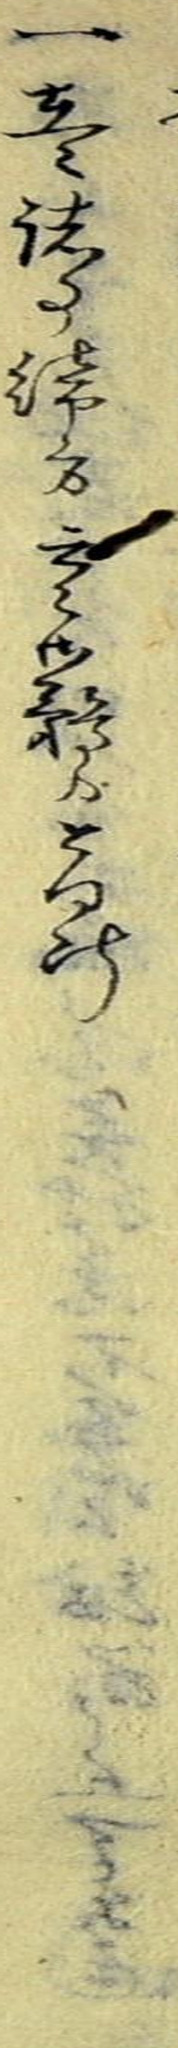一在々諸事締方云々御鵜方と同断

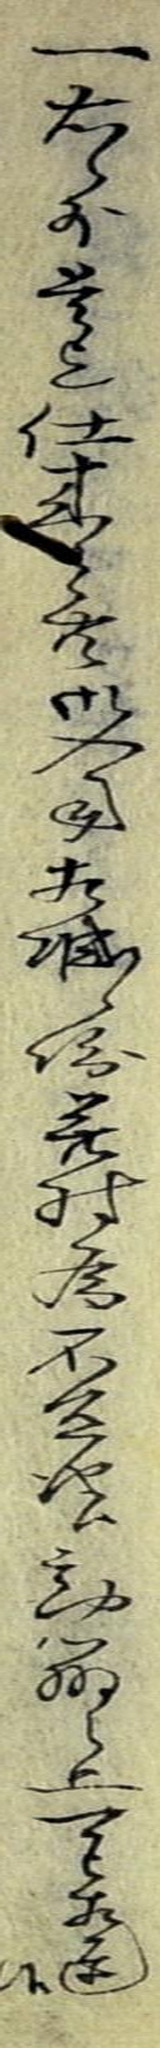一右之外是迄仕来ニ候共御入用相減候儀并村為不宜儀ハ勘弁之上可被相達候
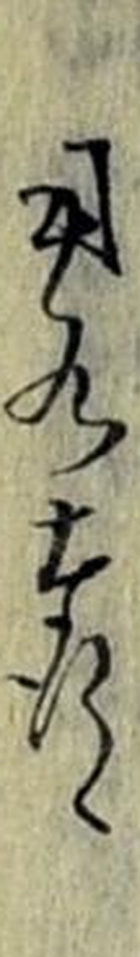用水奉行へ
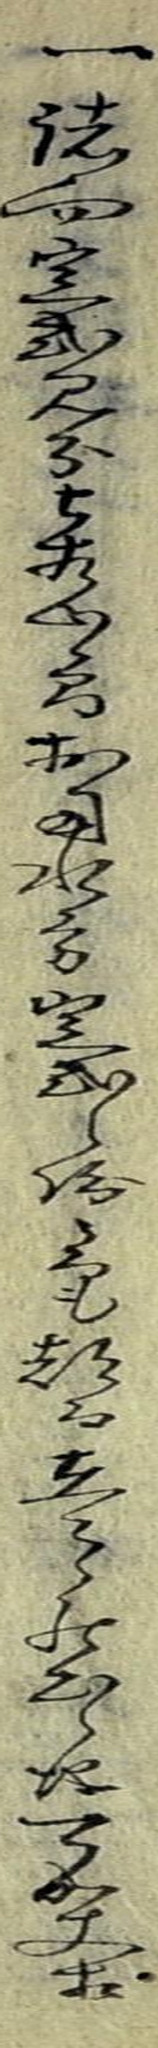一諸向定式見分被相止候間於用水方定式之儀ニ而も都而在々へ罷出候儀可成丈相
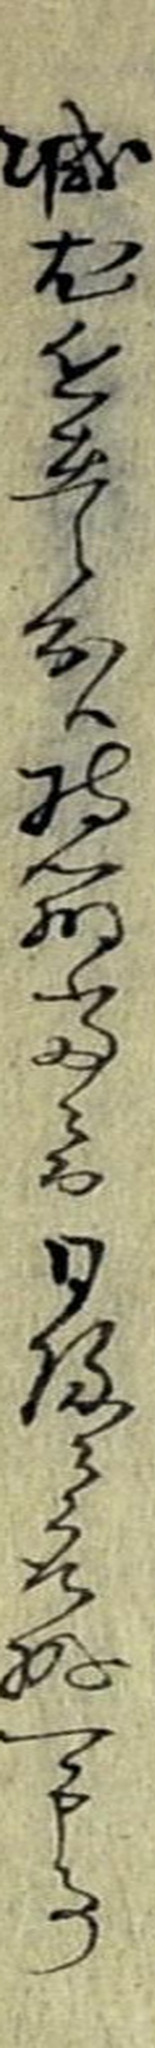減尤近在之分ハ持弁当ニ而日帰ニ取扱可申事
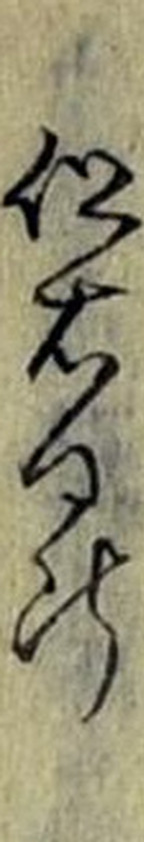但右同断
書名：命令之部 五
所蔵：福井県文書館 Fukui Prefectural Archives
